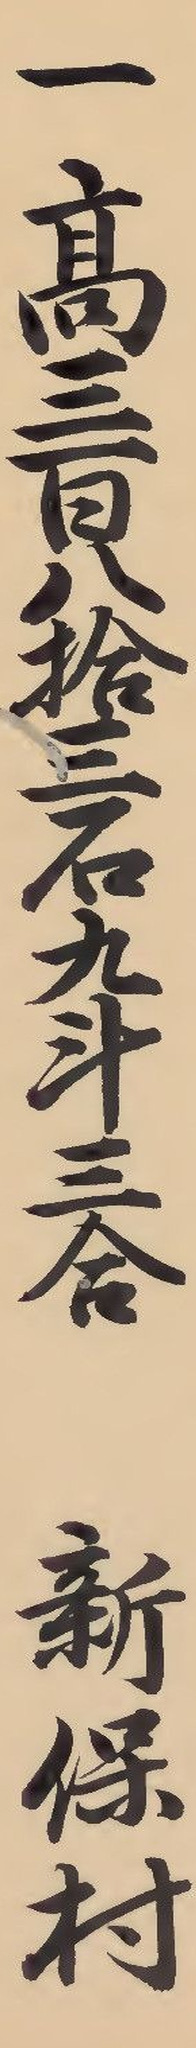一高三百八拾三石九斗三合新保村

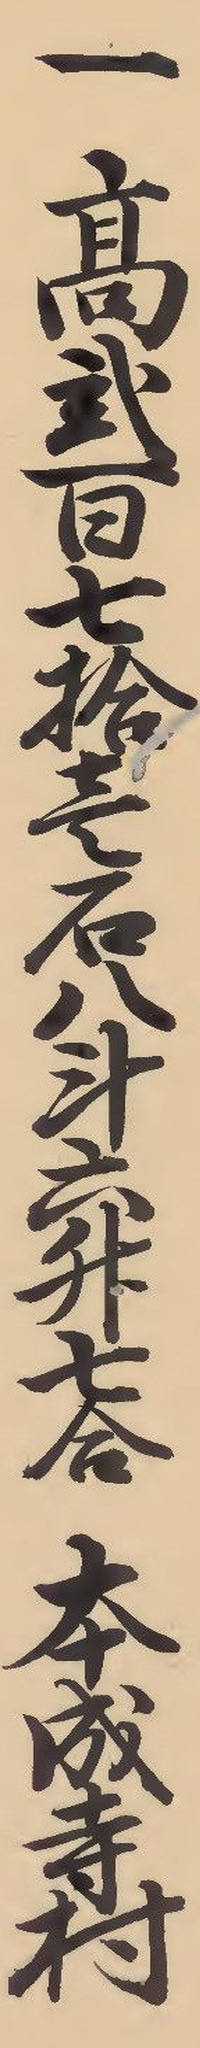一高弐百七拾壱石八斗六升七合本成寺村
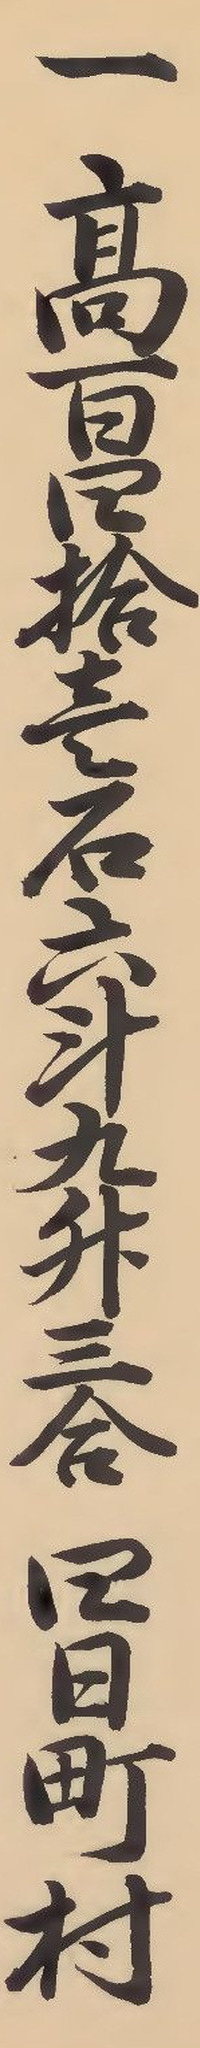一高百四拾壱石六斗九升三合四日町村
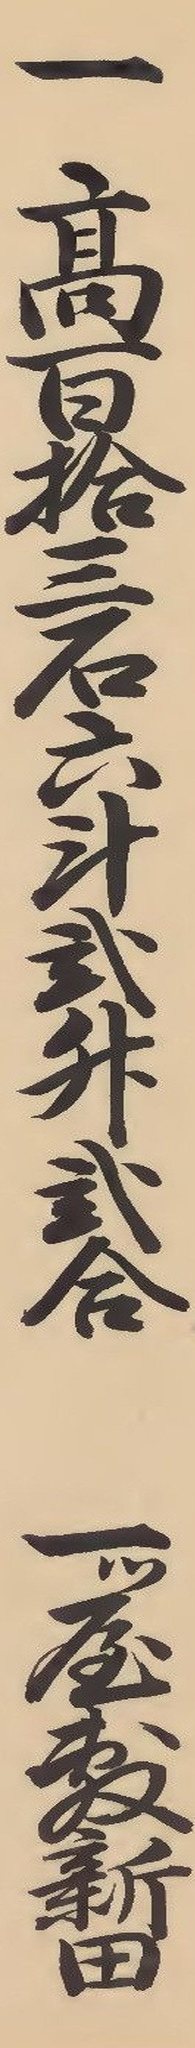一高百拾三石六斗弐升弐合一ツ屋敷新田
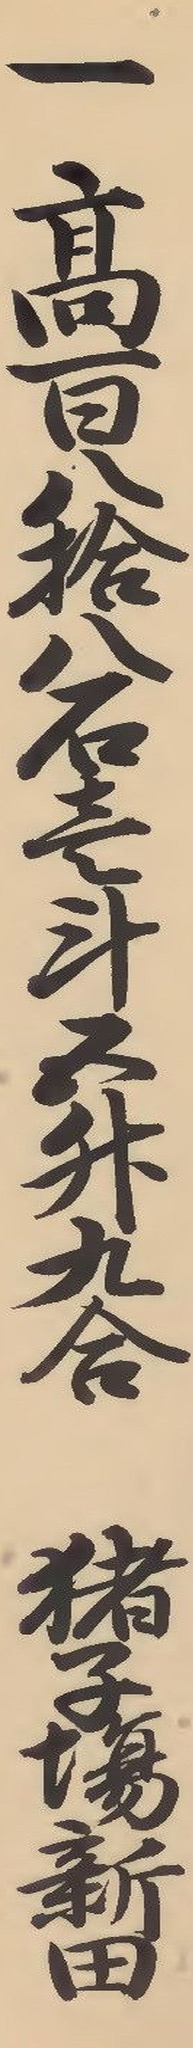一高百八拾八石壱斗五升九合猪子場新田
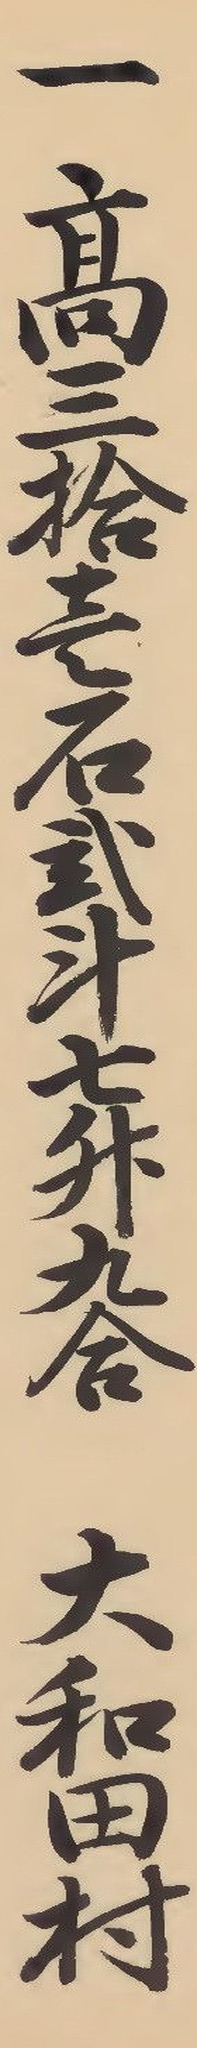一高三拾壱石弐斗七升九合大和田村
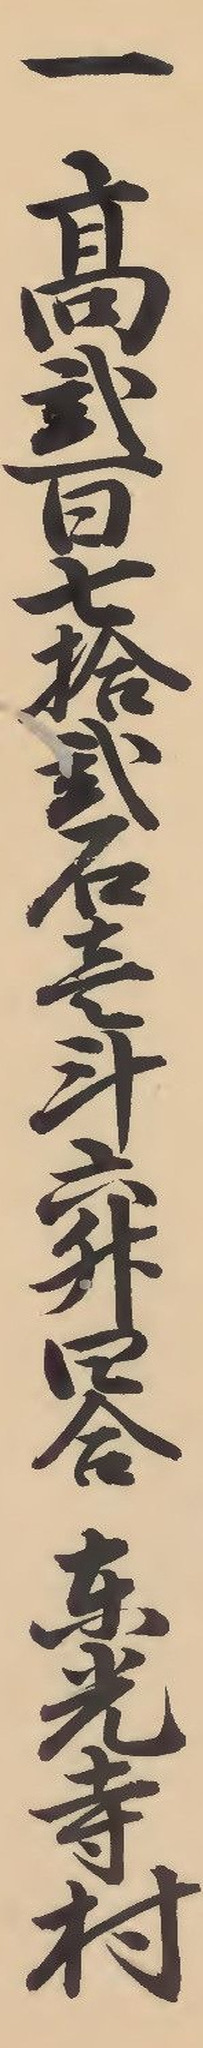一高弐百七拾弐石壱斗六升四合東光寺村

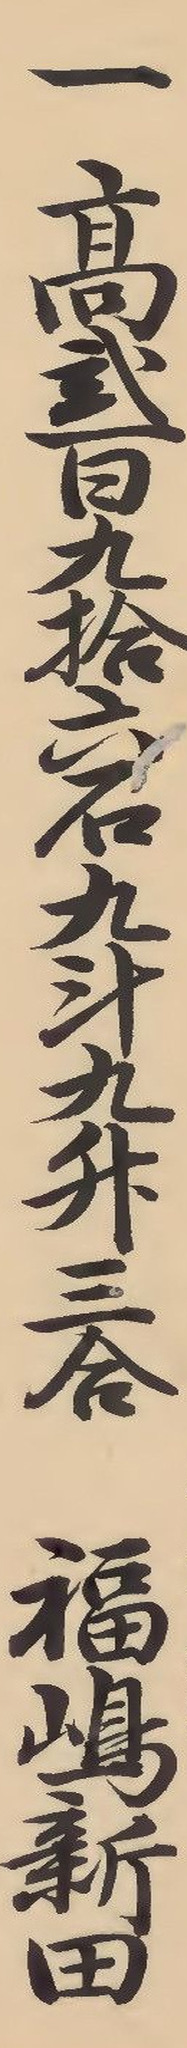一高弐百九拾六石九斗九升三合福島新田
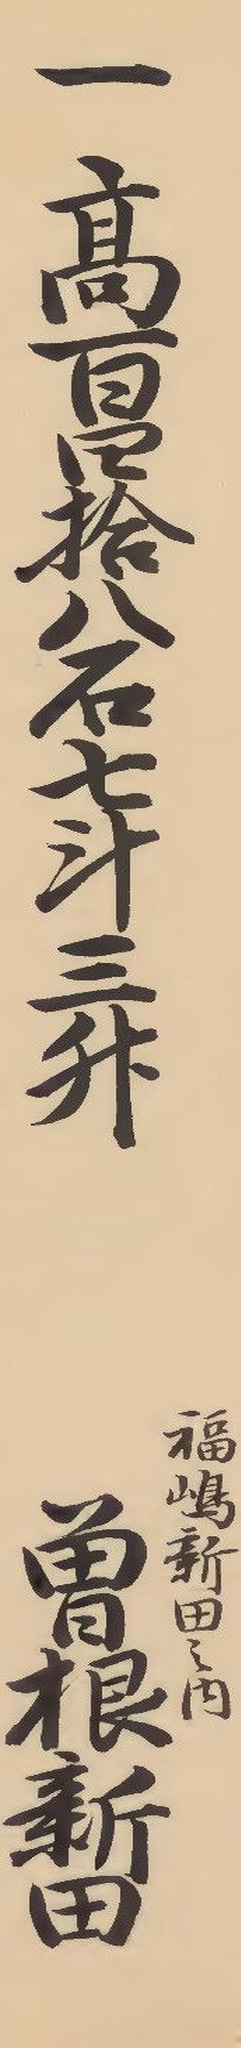一高百四拾八石七斗三升曽根新田
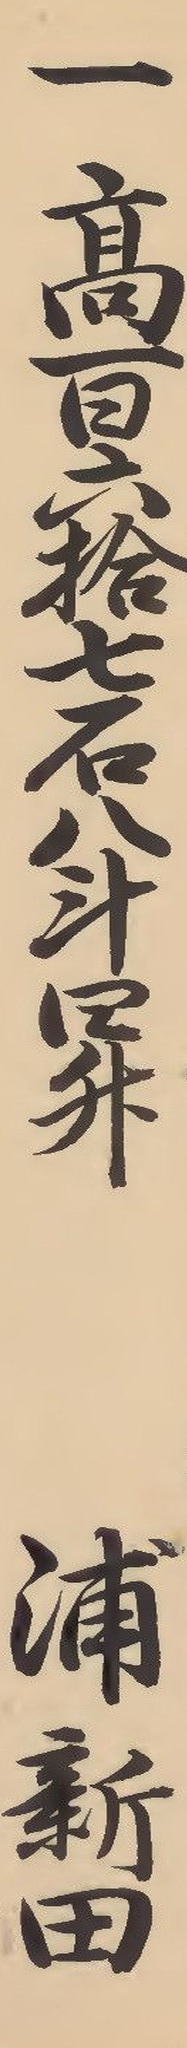一高百六拾七石八斗四升浦新田
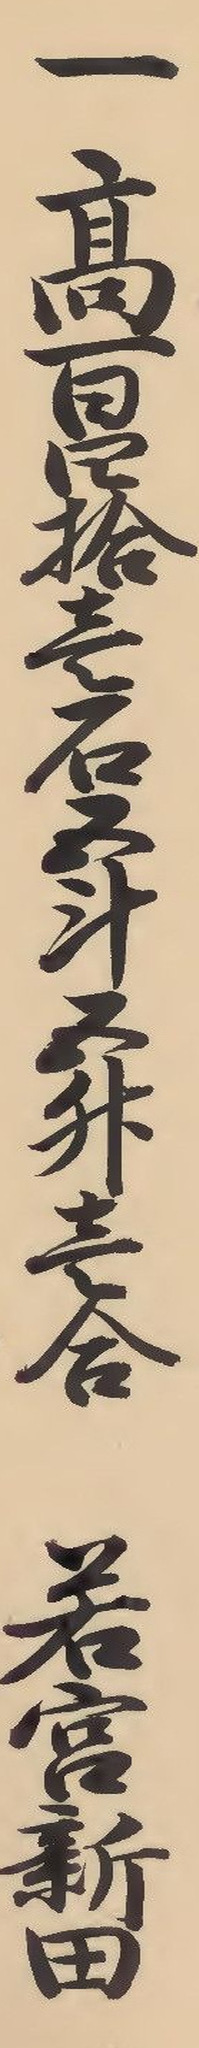一高百四拾壱石五斗五升壱合若宮新田
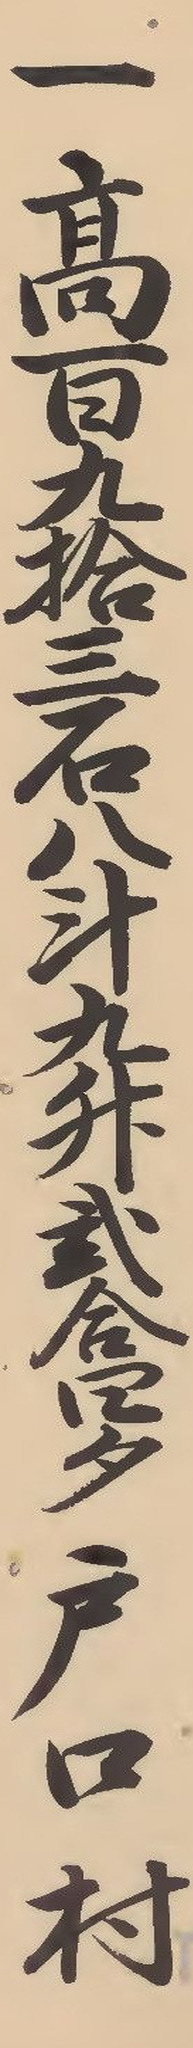一高百九拾三石八斗九升弐合四勺戸口村
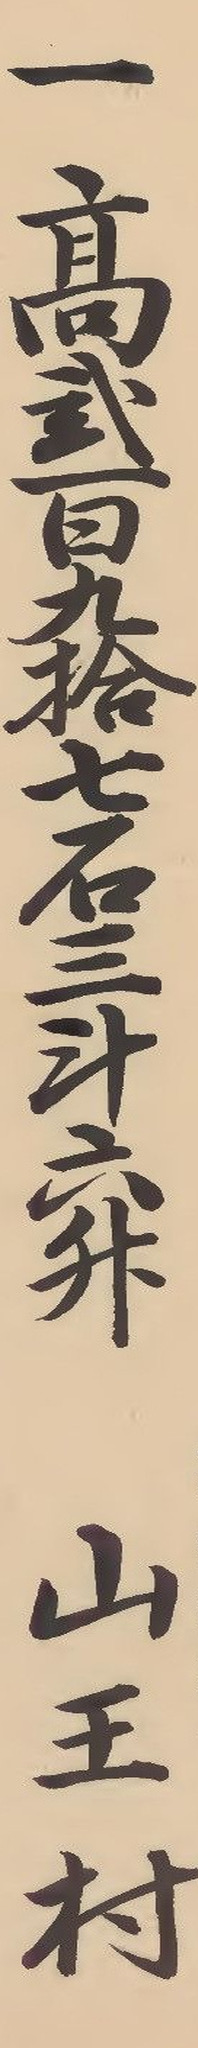一高弐百九拾七石三斗六升山王村

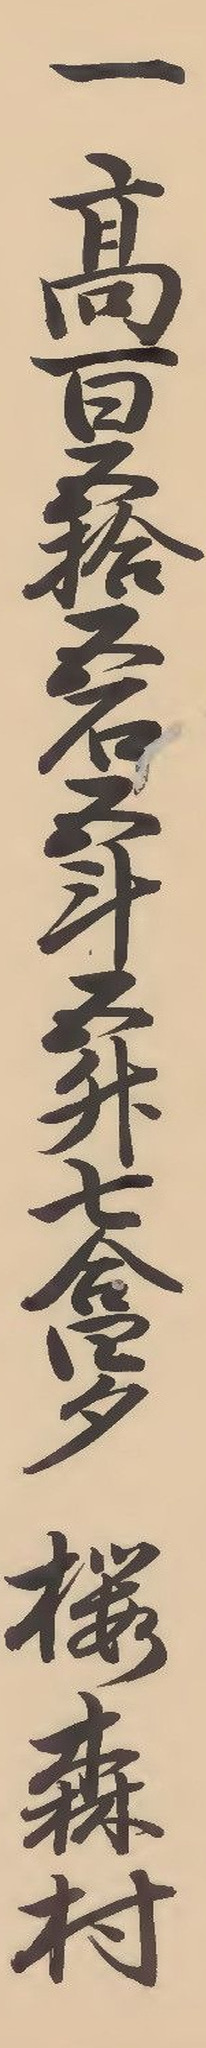一高百五拾五石五斗五升七合四勺桜森村
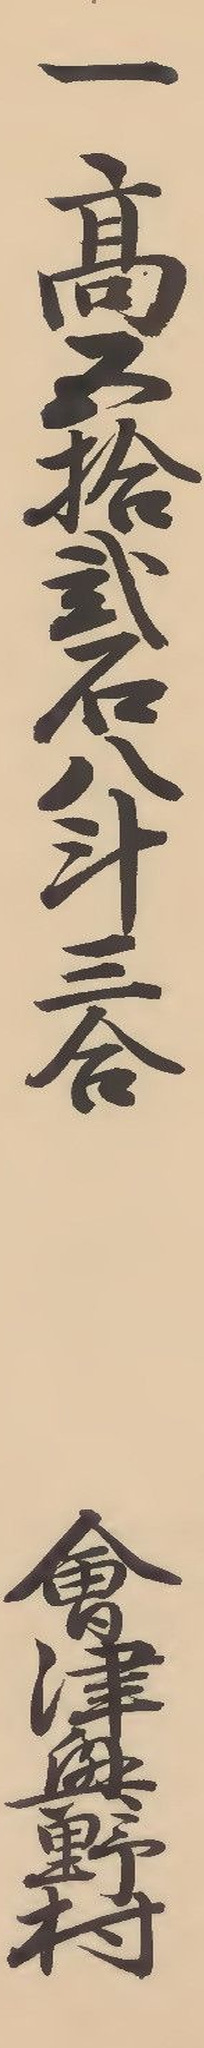一高五拾弐石八斗三合会津興野村
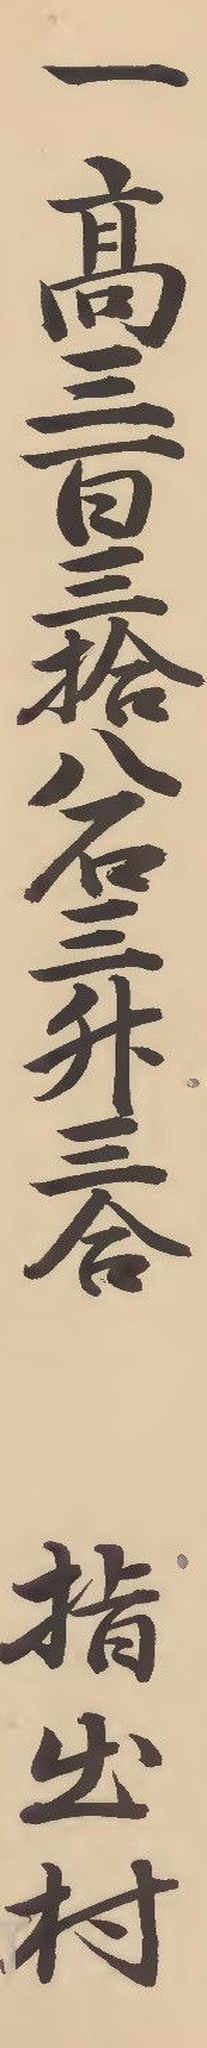一高三百三拾八石三升三合指出村
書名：越後国郷帳　下
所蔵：国立公文書館 National Archives of Japan
